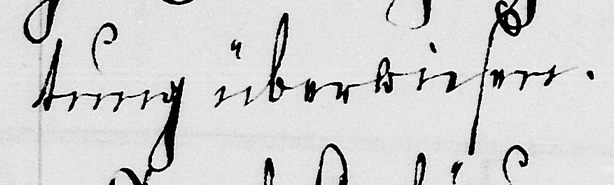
ttung überwiesen.
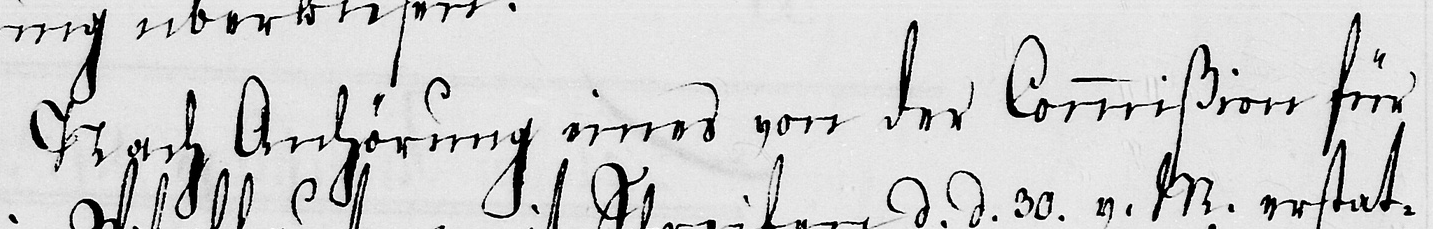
Nach Anhörung eines von der Commißion für
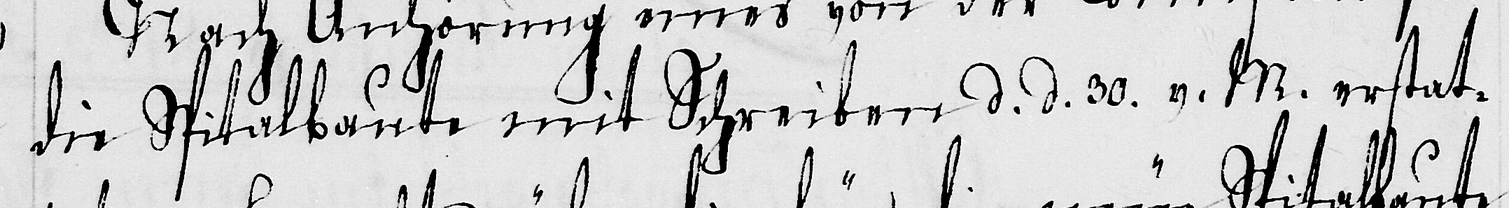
die Spitalbaute mit Schreiben d. d. 30. v. M. erstat¬
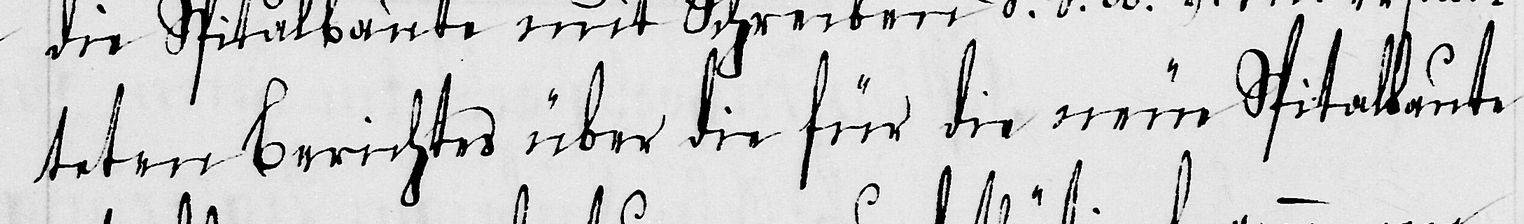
teten Berichtes über die für die neue Spitalbaute
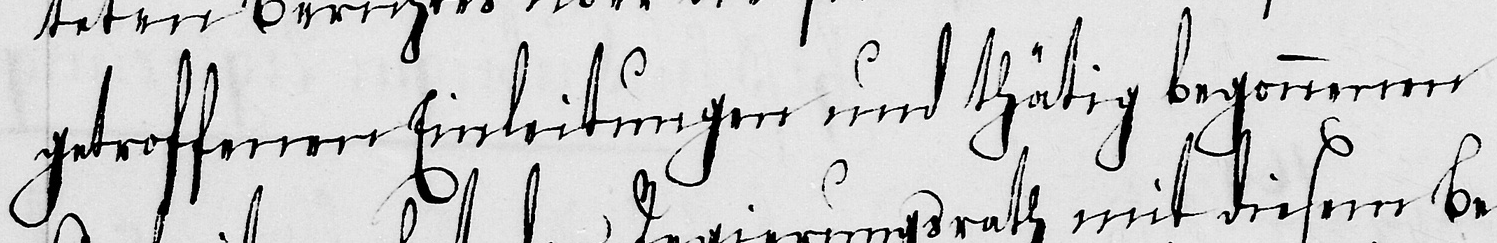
getroffenen Einleitungen und thätig begonnenen
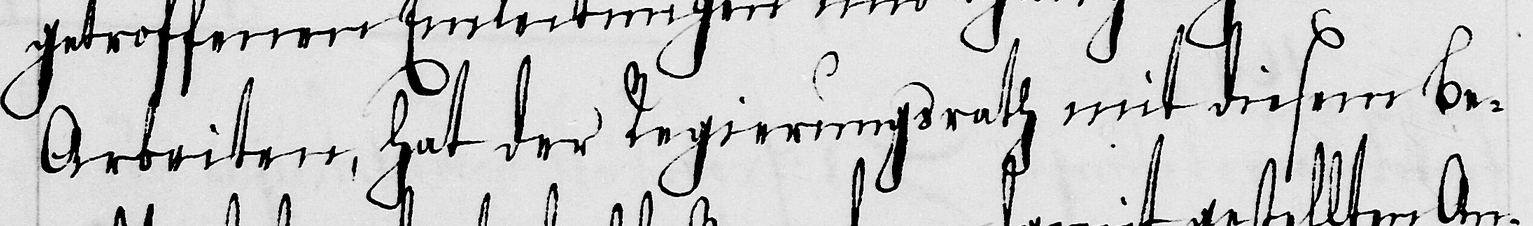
Arbeiten, hat der Regierungsrath mit diesem Be¬
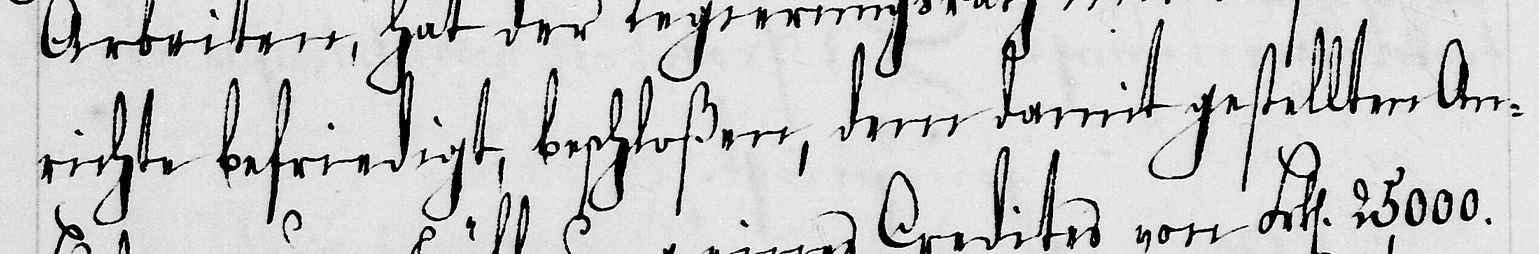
richte befriedigt, beschloßen, dem damit gestellten An¬
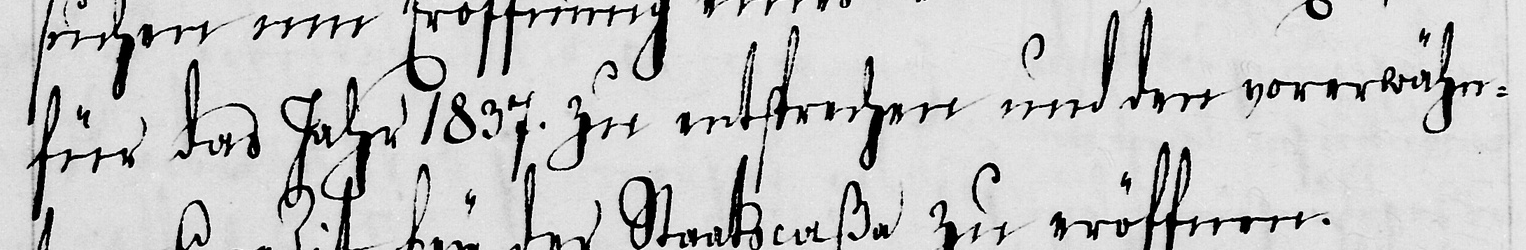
für das Jahr 1837. zu entsprechen und den vorerwähn¬
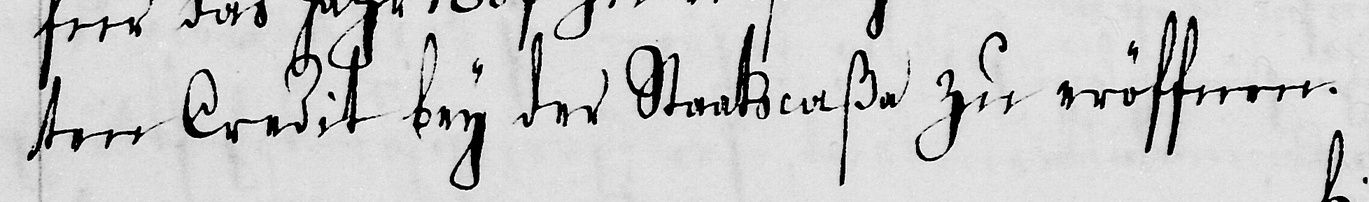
ten Credit bey der Staatscaßa zu eröffnen.
